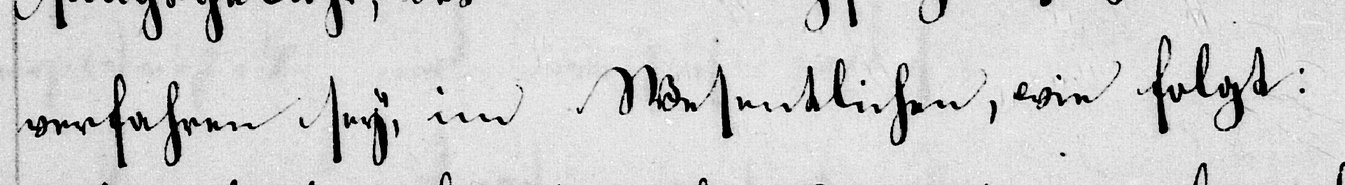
verfahren sey, im Wesentlichen, wie folgt:
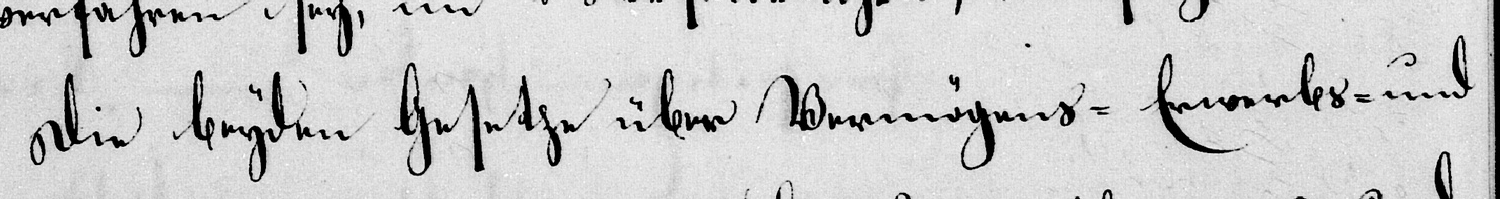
Die beyden Gesetze über Vermögens- Erwerbs- und
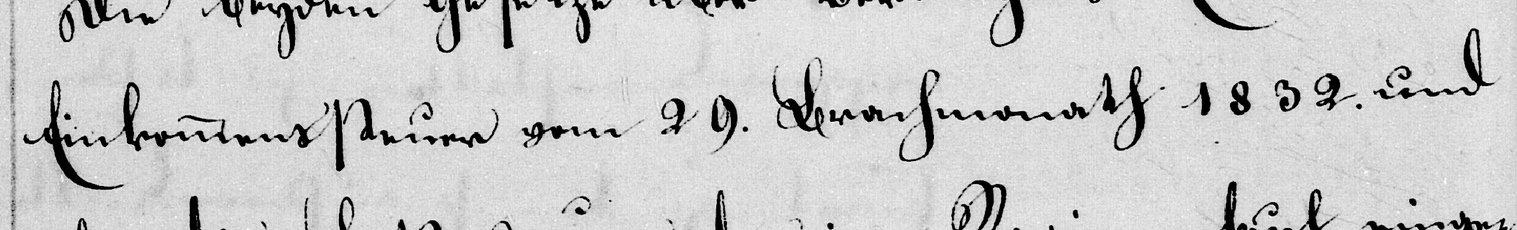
Einkommenssteuer vom 29. Brachmonath 1832. und
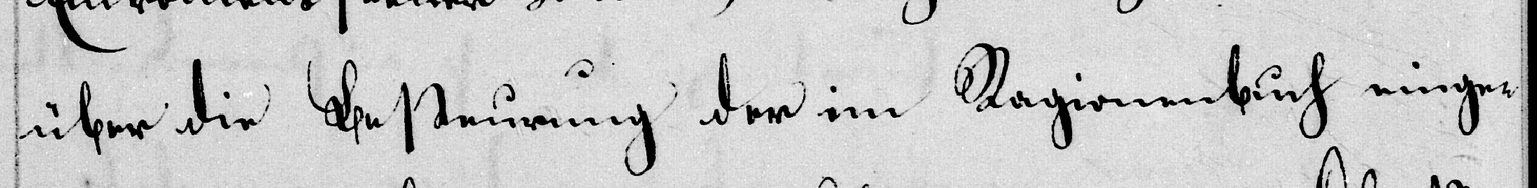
über die Besteurung der im Ragionenbuch einge¬
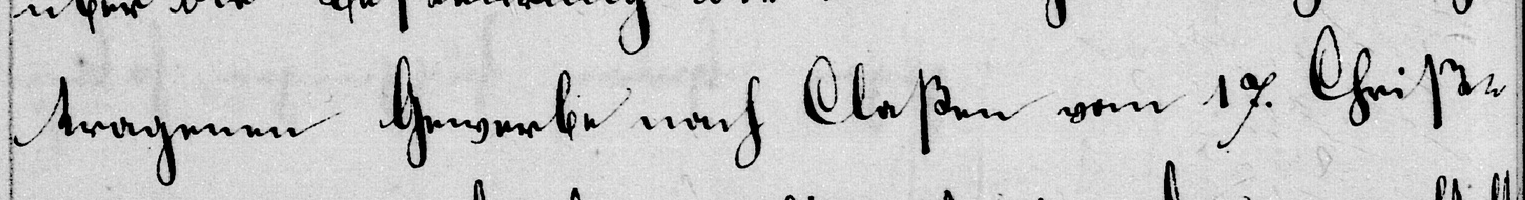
tragenen Gewerbe nach Claßen vom 17. Christh¬
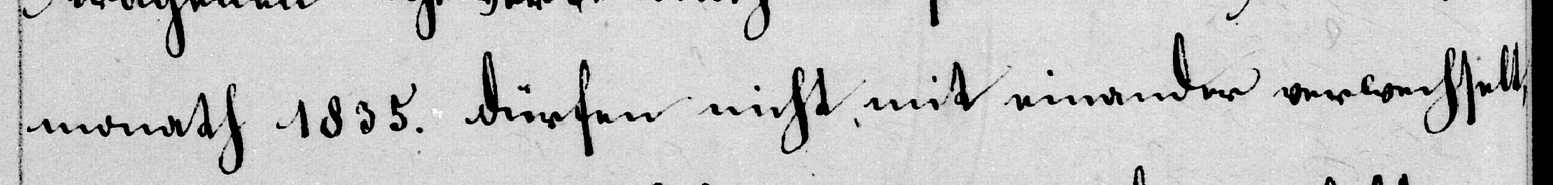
monath 1835. dürfen nicht mit einander verwechselt,
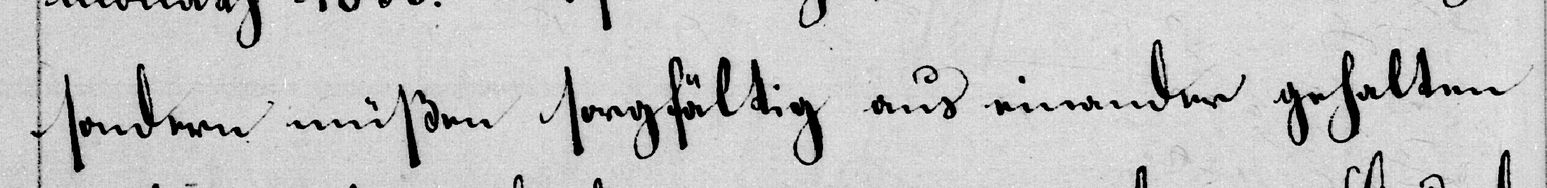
sondern müßen sorgfältig aus einander gehalten
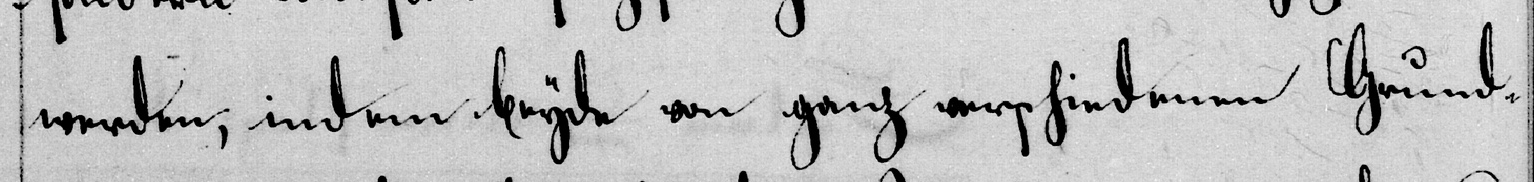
werden, indem beyde von ganz verschiedenen Grund¬
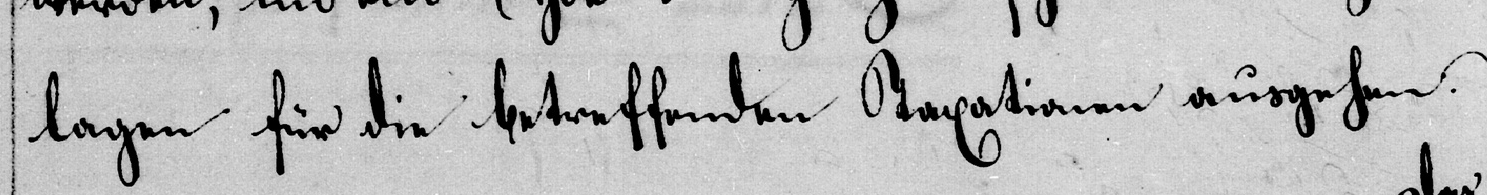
lagen für die betreffenden Taxationen ausgehen.
